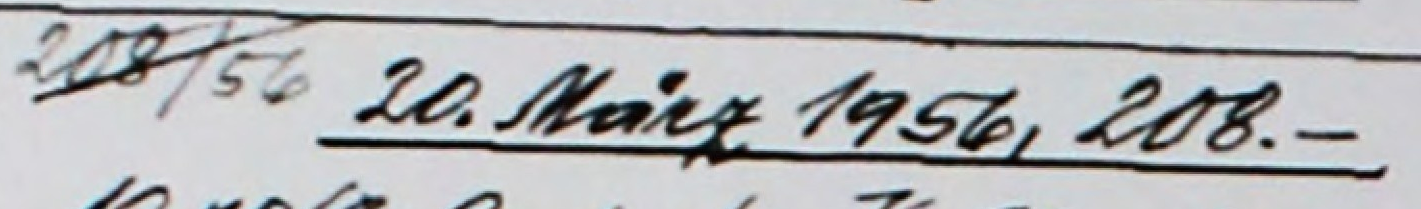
208/56 20. März 1956, 208.-
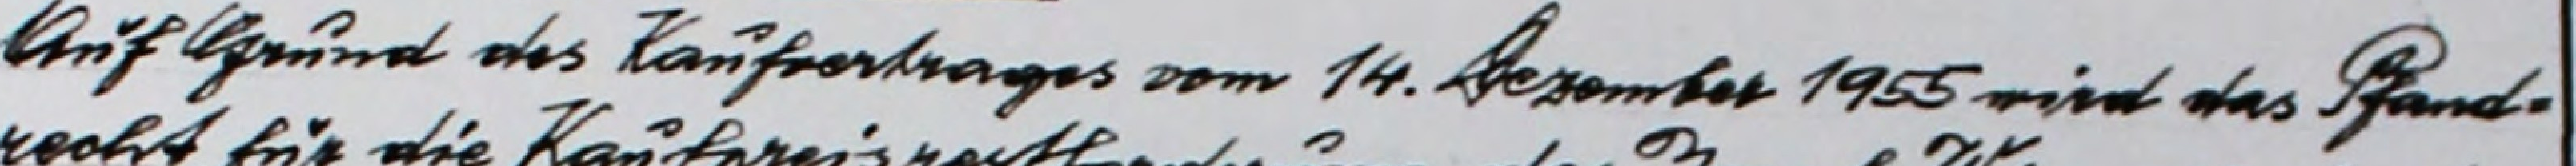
Auf Grund des Kaufvertrages vom 14. Dezember 1955 wird das Pfand=
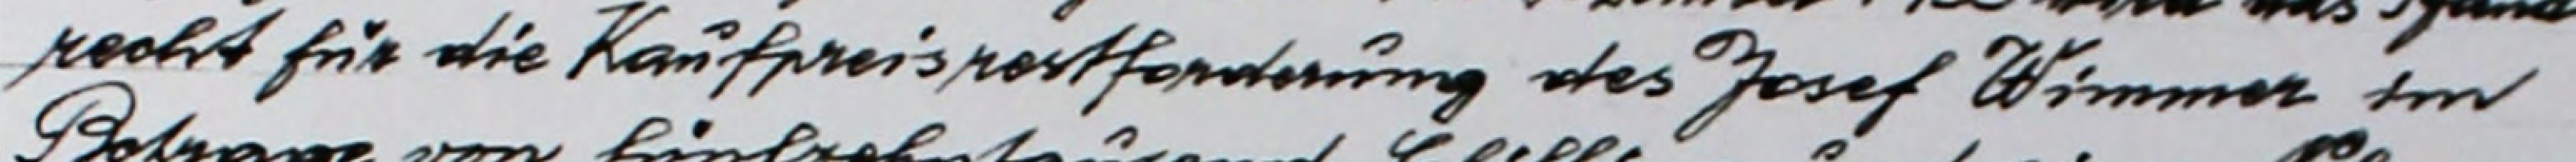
recht für die Kaufpreisrestforderung des Josef Wimmer von
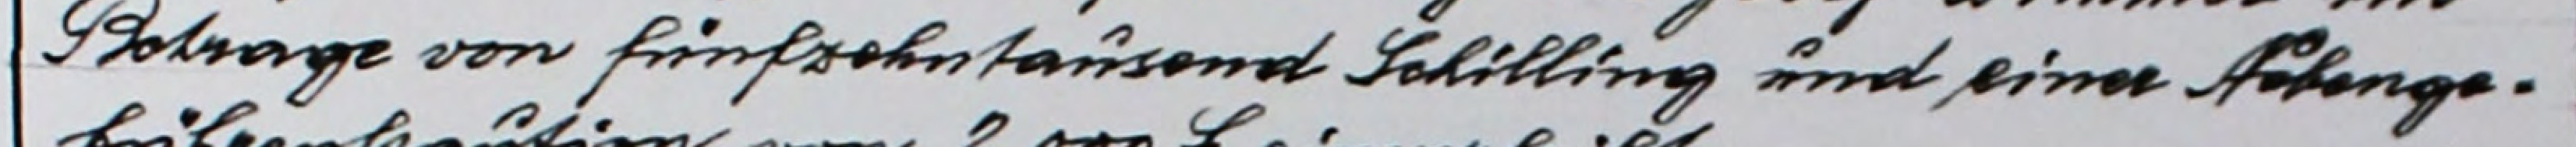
Betrage von fünfzehntausend Schilling und einer Nebenge=
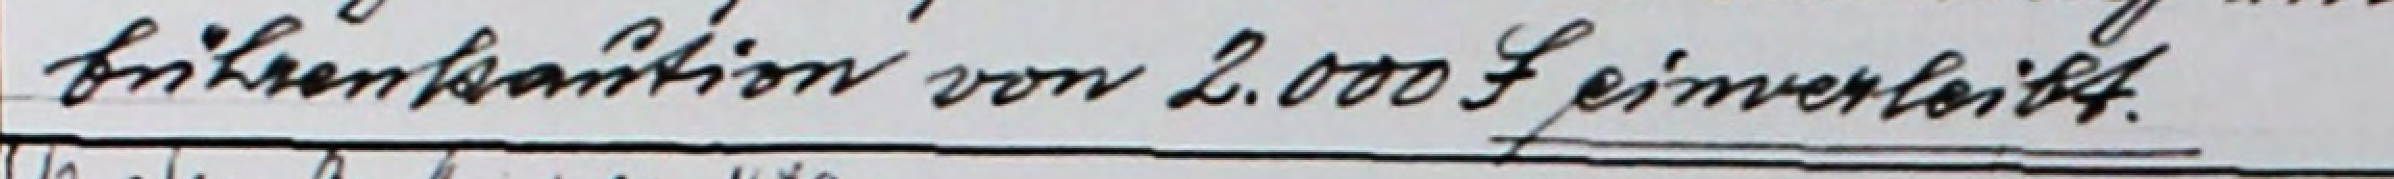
bührenkaution von 2.000 F einverleibt.
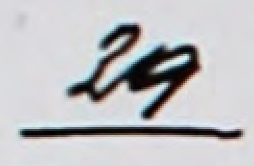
29
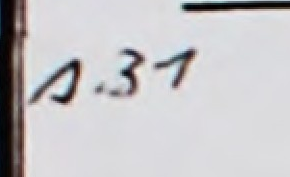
s. 31
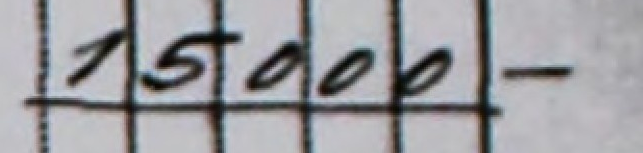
15000 –
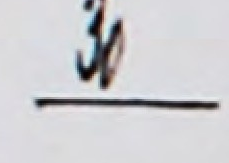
30
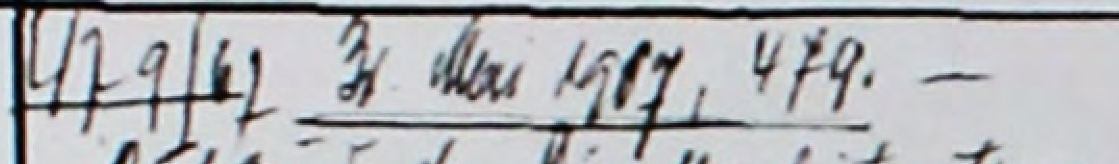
479/67 3. Mai 1967, 479.-
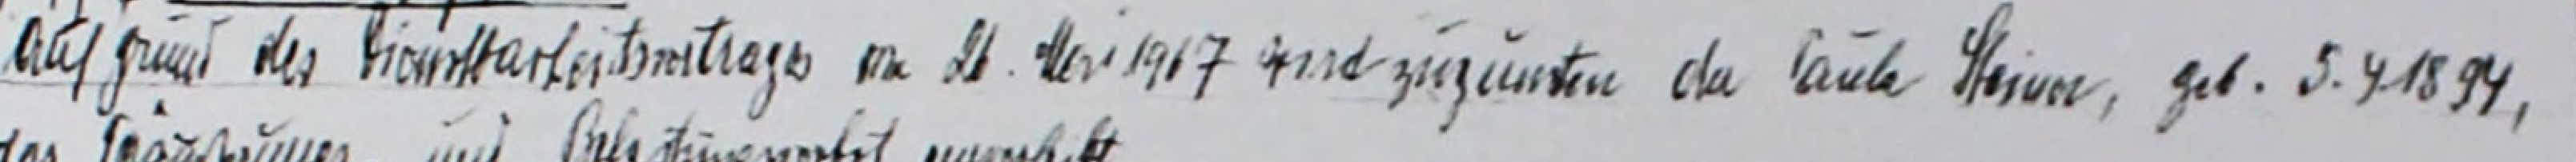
Auf Grund des Dienstbarkeitsvertrage vom 26. Mai 1967nund zugunsten da Taule Steiner, geb. 5.4.1894,
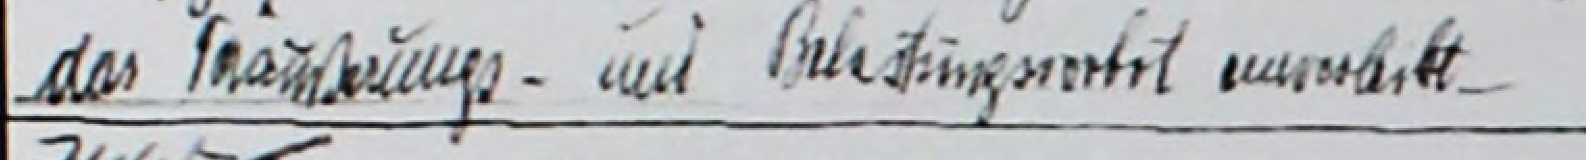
das Veräußerungs- und Belastungsverbot enverleibt-
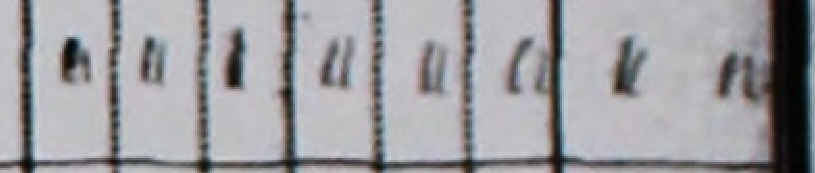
„„„„„„„„
